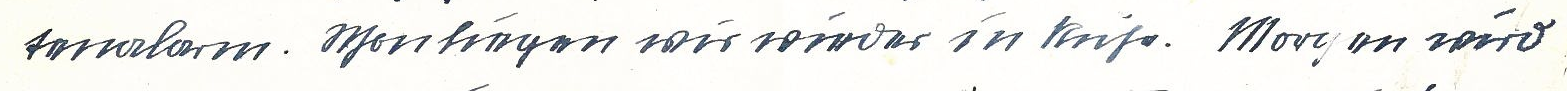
tenalarm. Schon liegen wir wieder in Ruhe. Morgen wird
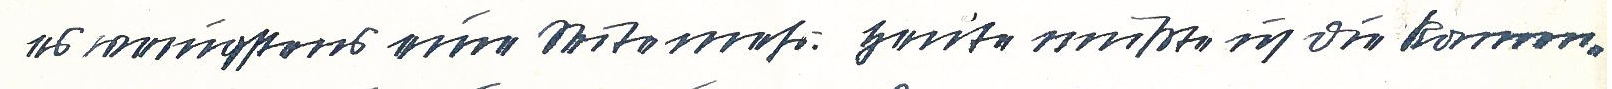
es wenigstens eine Seite mehr: Heute mußte ich die K.er
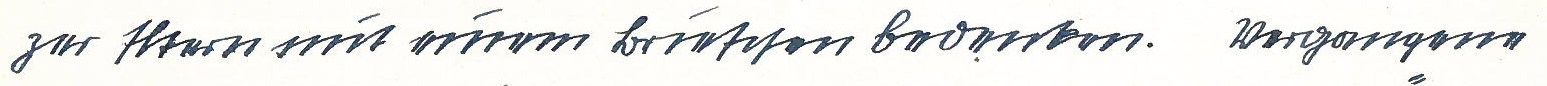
Eltern mit einem Briefchen bedenken. Vergangene
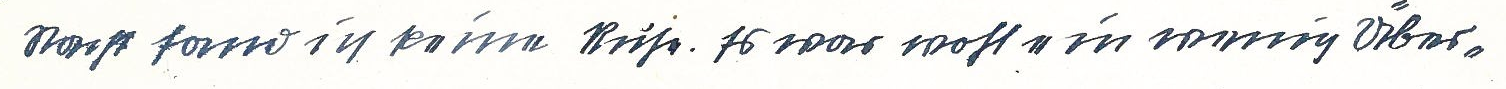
Nacht fand ich keine Ruhe. Es war wohl ein wenig Über¬
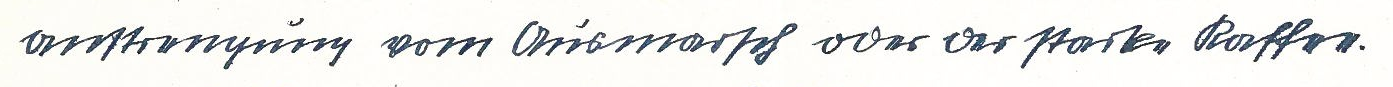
anstrengung vom Ausmarsch oder der starke Kaffee.
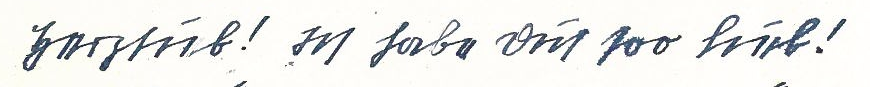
Herzlieb! Ich habe Dich so lieb!
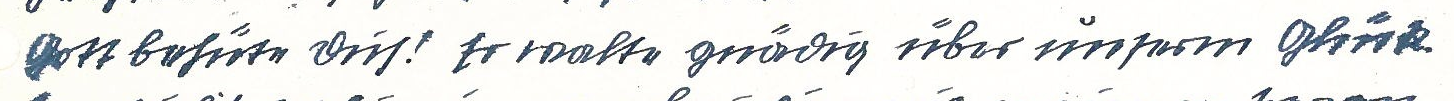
Gott behüte Dich! Er walte gnädig über unserm Glück.
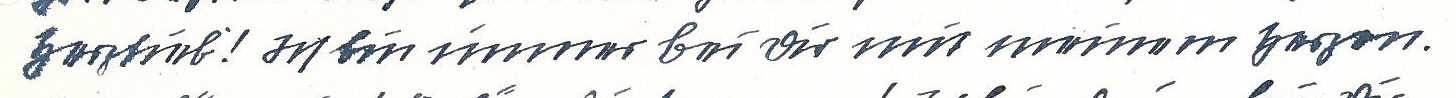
Herzlieb! Ich bin immer bei Dir mit meinem Herzen.
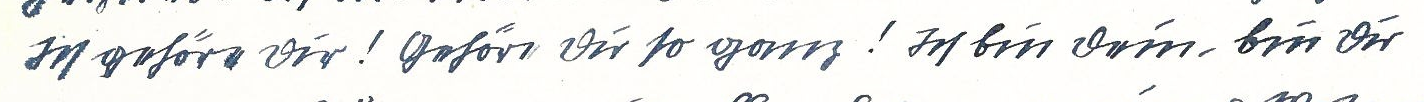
Ich gehöre Dir! Gehöre Dir so ganz! Ich bin Dein, bin Dir
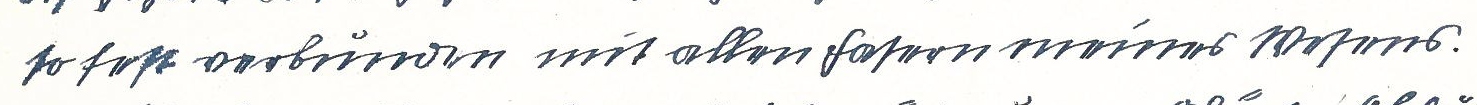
so fest verbunden mit allen Fasern meines Wesens.
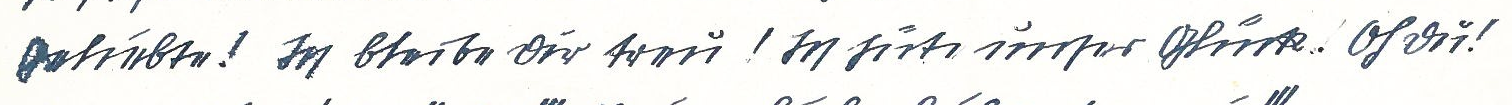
Geliebte! Ich bleibe Dir treu! Ich hüte unser Glück. Oh Du!
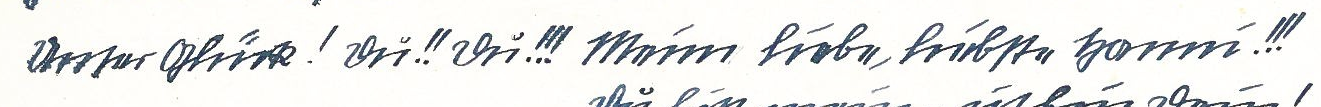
Unser Glück! Du!! Du!!! Meine liebe, liebste !!!
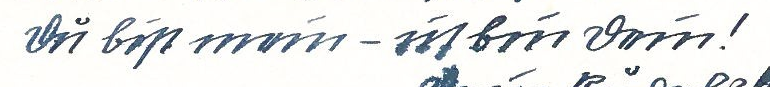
Du bist mein – ich bin Dein!
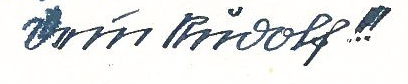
Dein !!!
